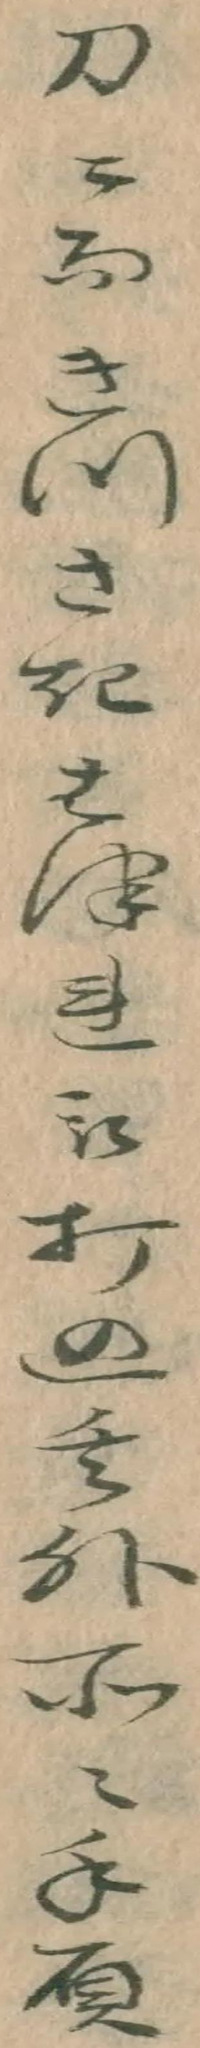刀に而きつさきはつれ被打込其外所々手負
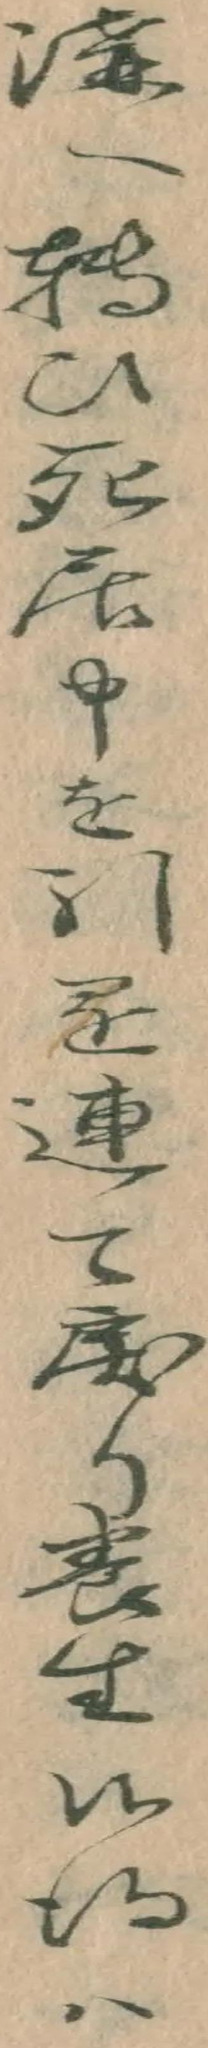溝へ転ひ死居申を引懸連て戻り養生候得は
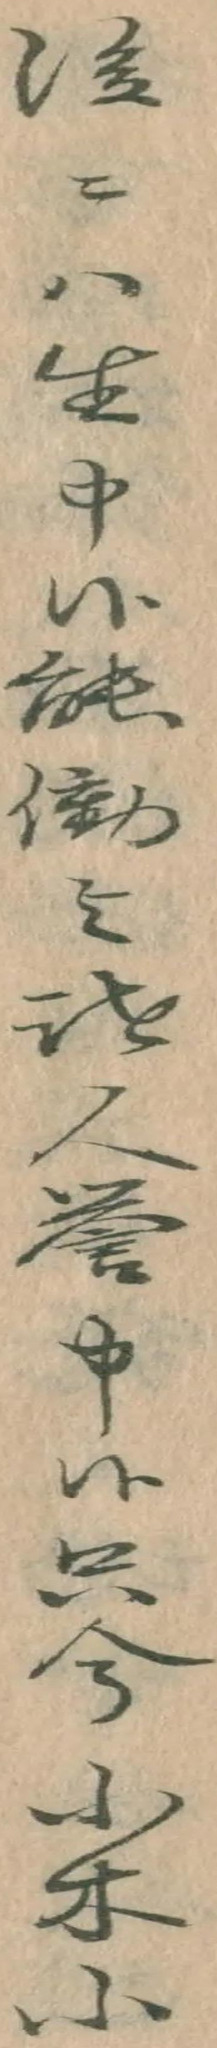後には生申候能働与諸人誉申候只今小木小
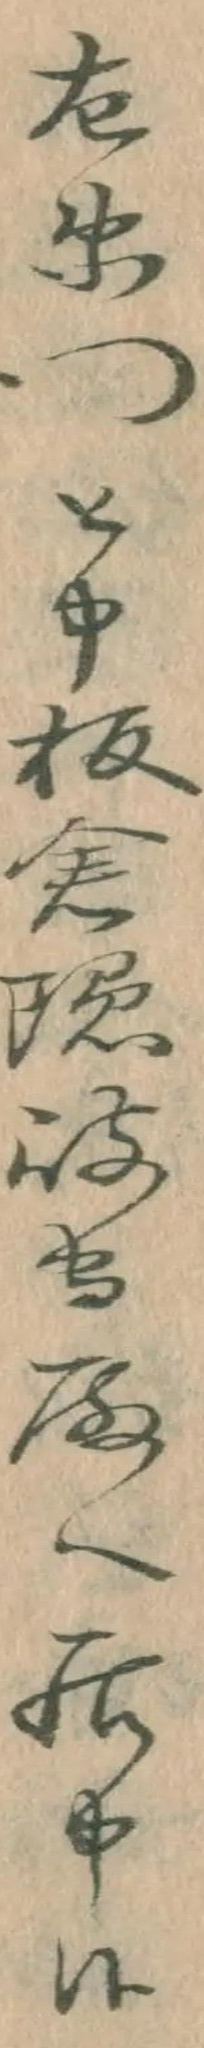左衛門と申板倉隠岐守殿へ居申候
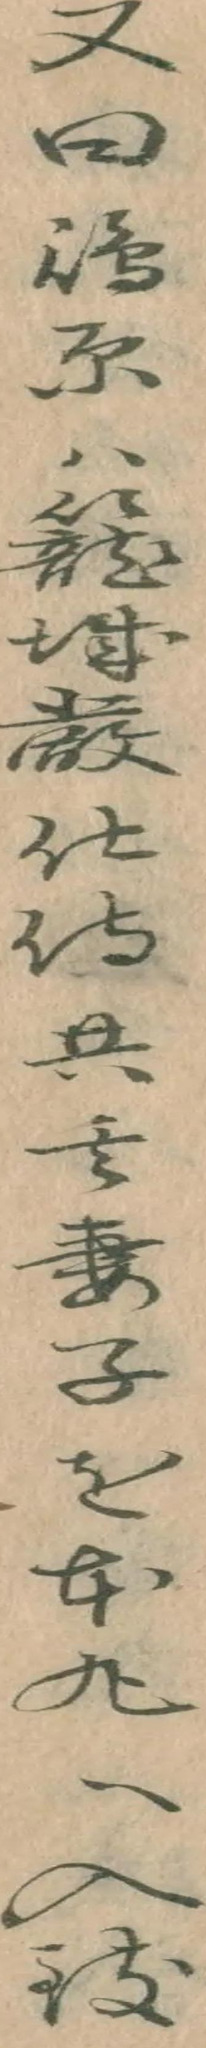又曰島原は籠城厳仕侍共其妻子を本丸へ入致
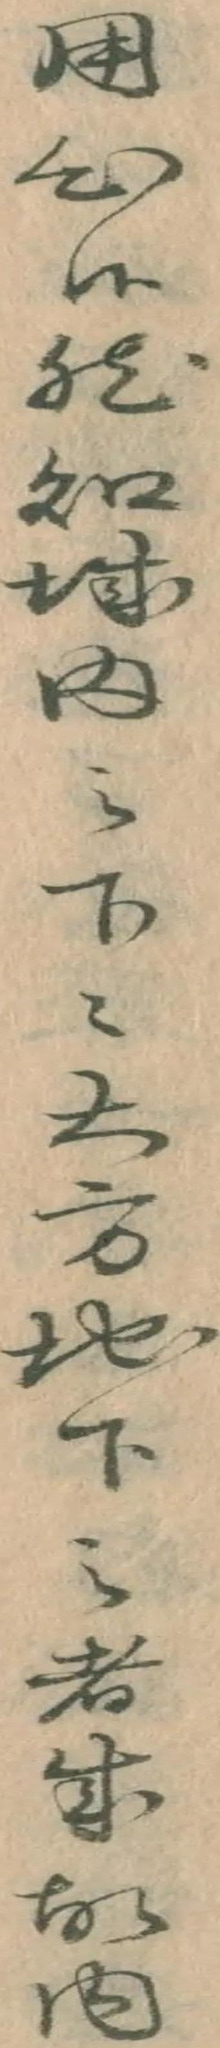用心候然処城内之下々大方地下之者成故内

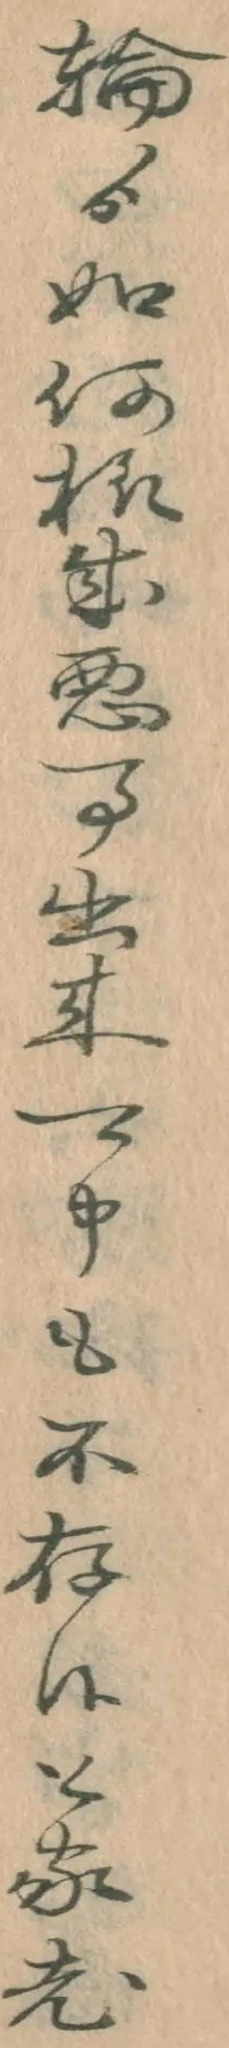輪ゟ如何成悪事出来可申も不存候と家老
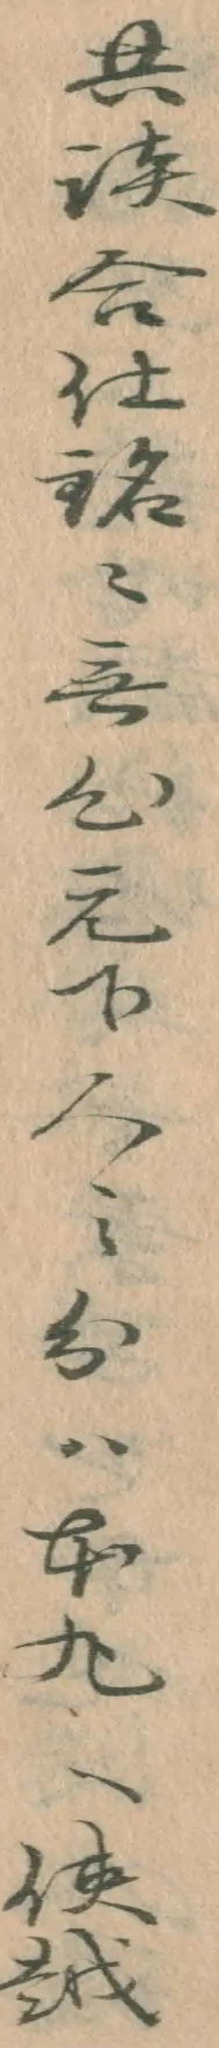共談合仕銘々無心元下人之分は本丸へ使越
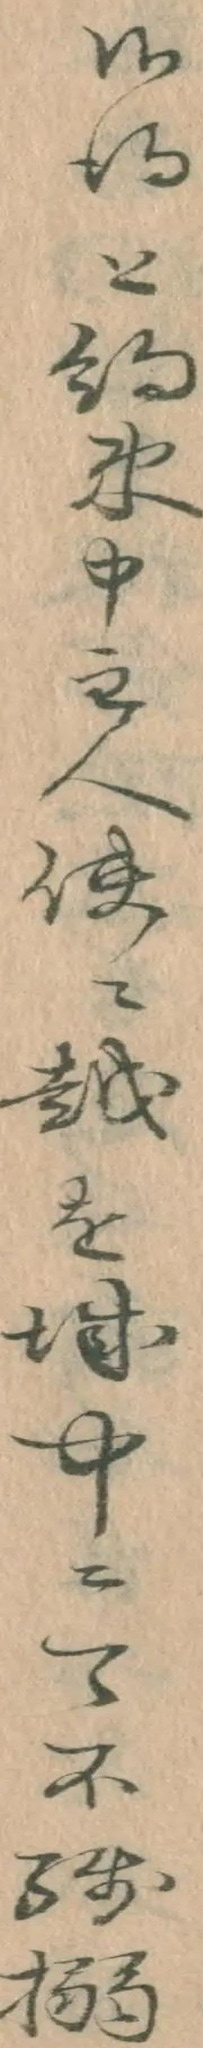候得と約束申主人使に越を城中にて不残搦
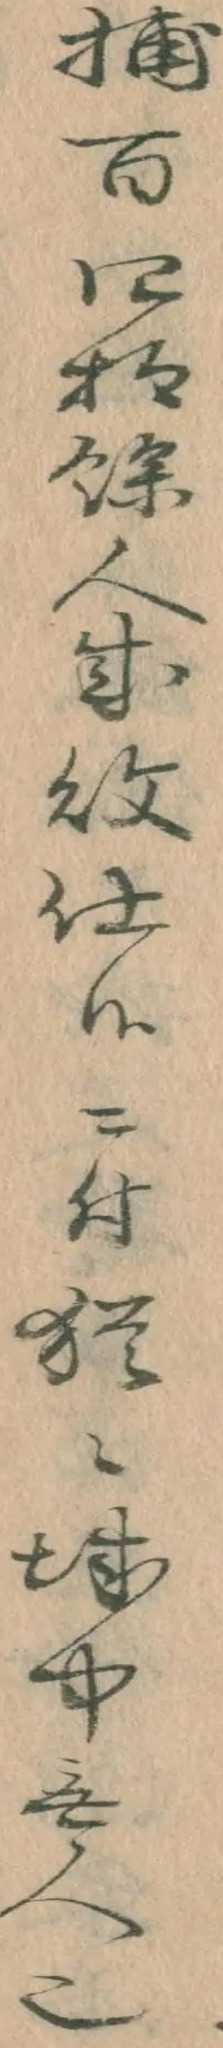捕百四拾余人成敗仕候に付猶々城中無人也
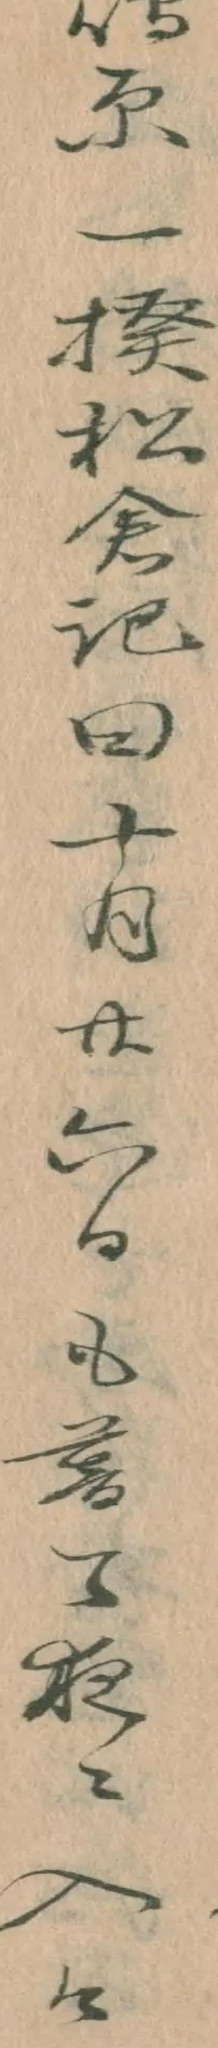島原一揆松倉記日十月廿六日も暮て夜に入け
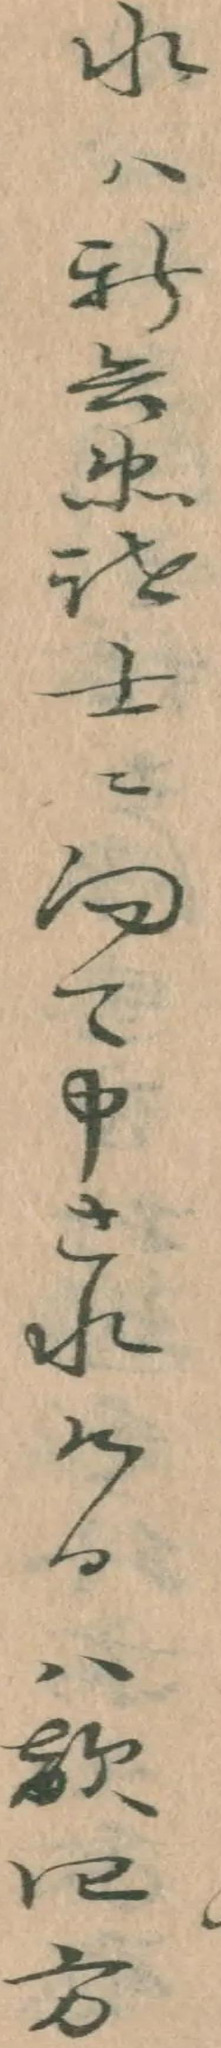れは新兵衛諸士に向て申されけるは敵四方
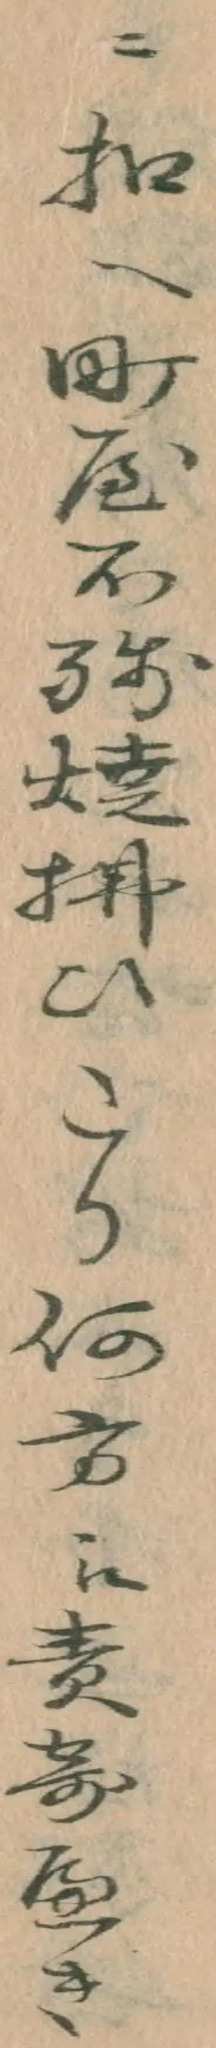に扣へ町屋不残焼払ひたり何方え責寄へき
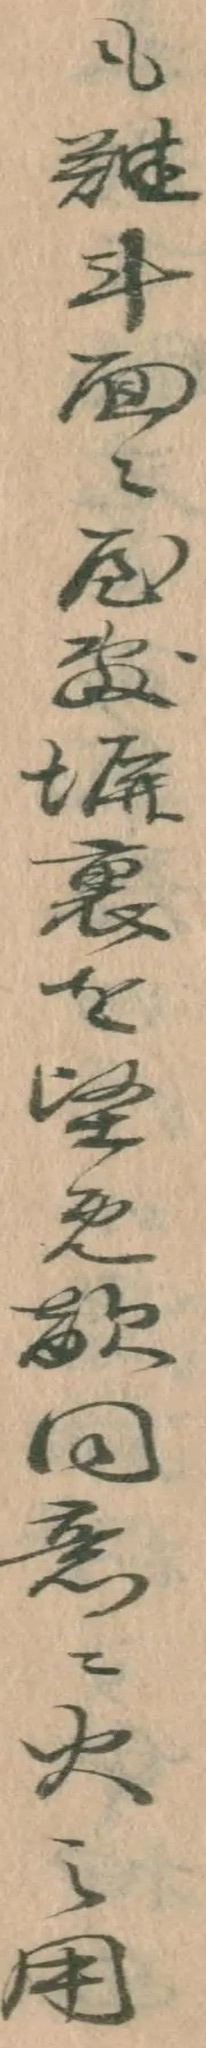も難斗面々屋敷塀裏を堅め敵同意に火之用
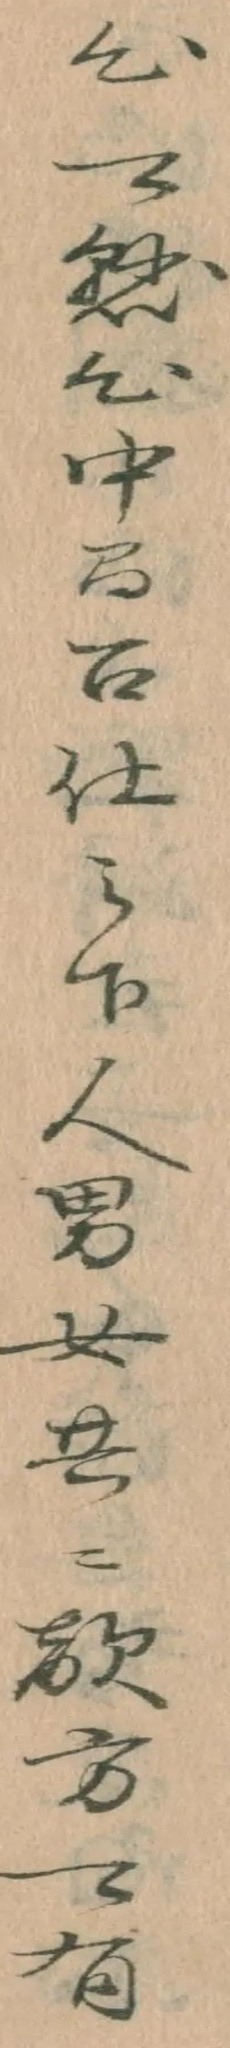心可懸心中間召仕之下人男女共に敵方可有
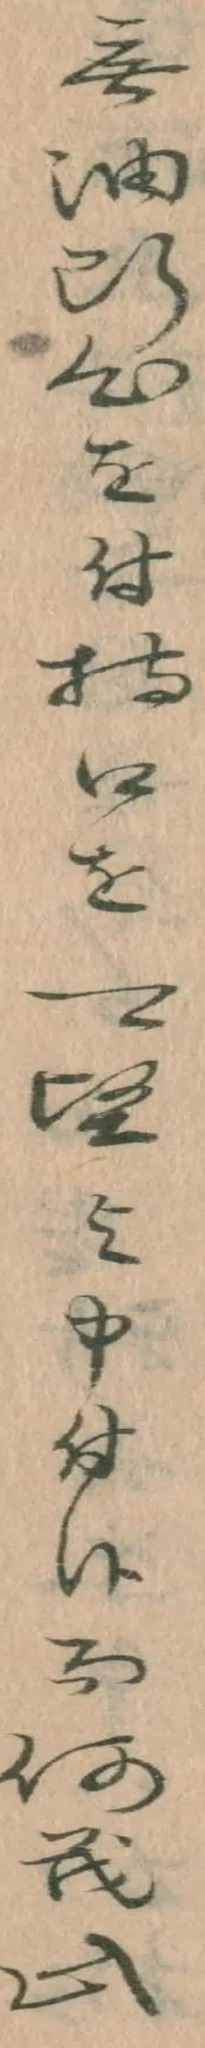無油断心を付持口を可堅与申付候而何も此
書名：切支丹御退治記 49巻. [1]
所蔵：国立国会図書館 National Diet Library, JAPAN
